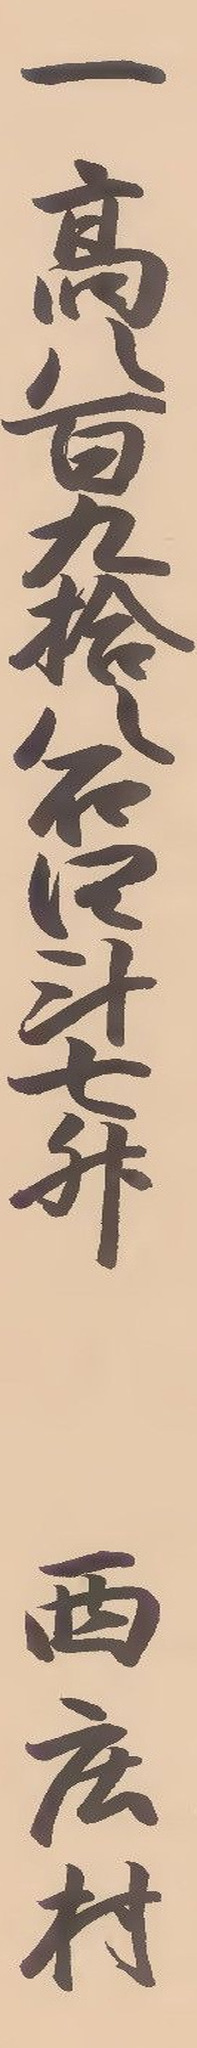一高八百九拾八石四斗七升西庄村

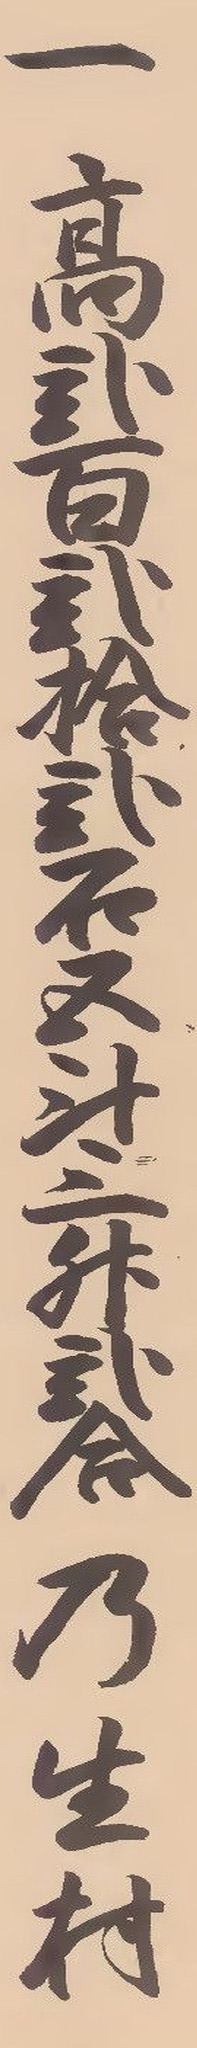一高弐百弐拾弐石五斗三升弐合乃生村
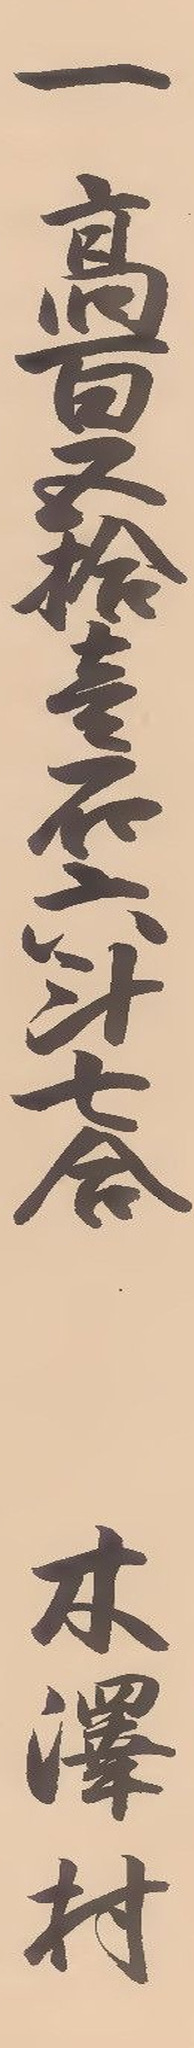一高百五拾壱石六斗七合木沢村
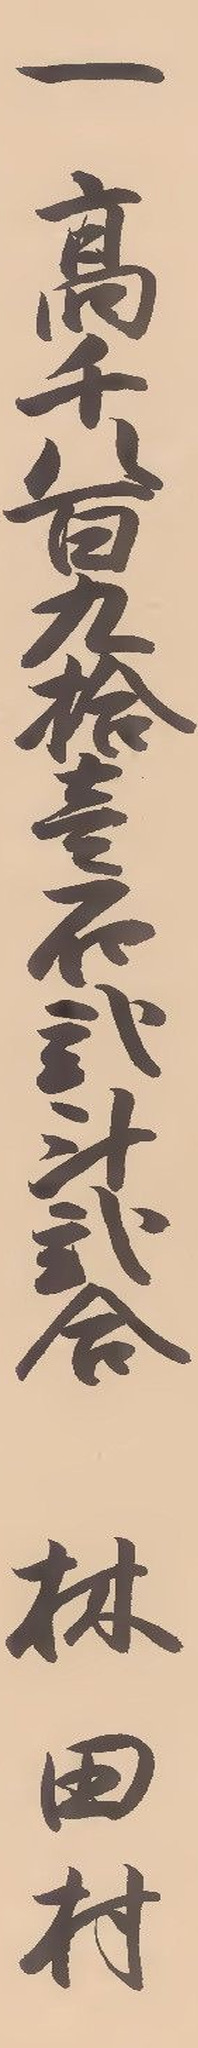一高千八百九拾壱石弐斗弐合林田村
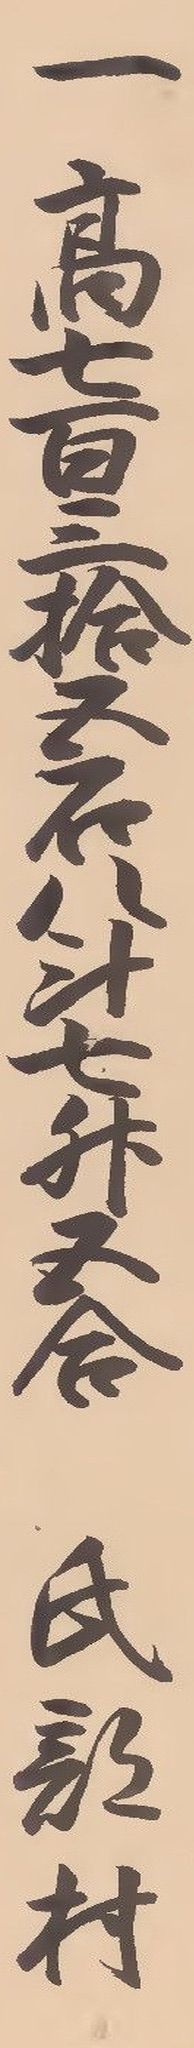一高七百三拾五石八斗七升五合氏部村
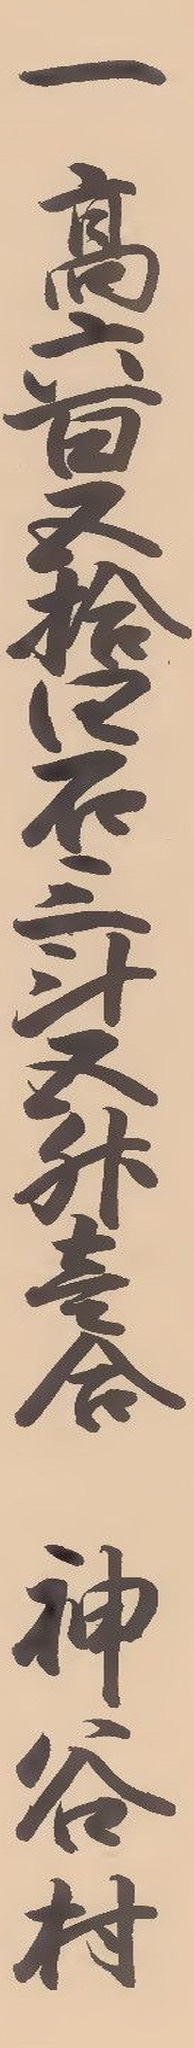一高六百五拾四石三斗五升壱合神谷村
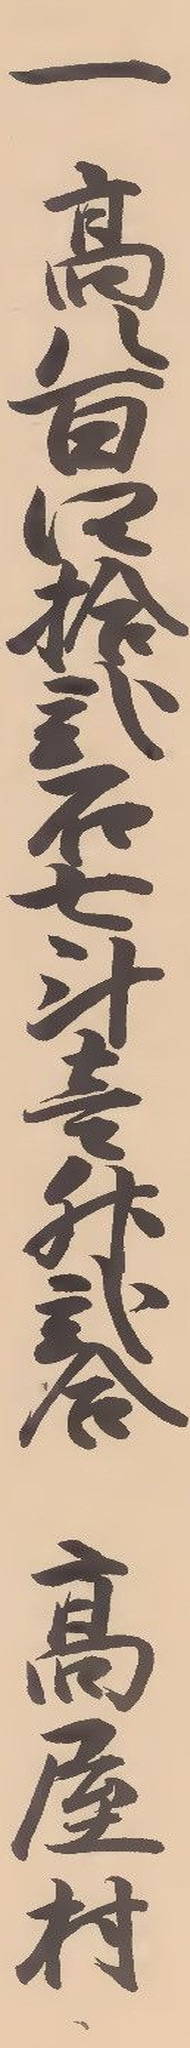一高八百四拾弐石七斗壱升弐合高屋村
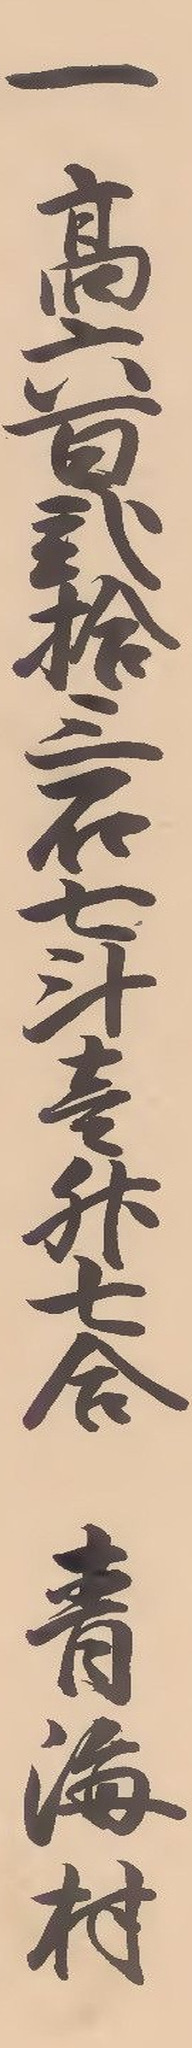一高六百弐拾三石七斗壱升七合青海村

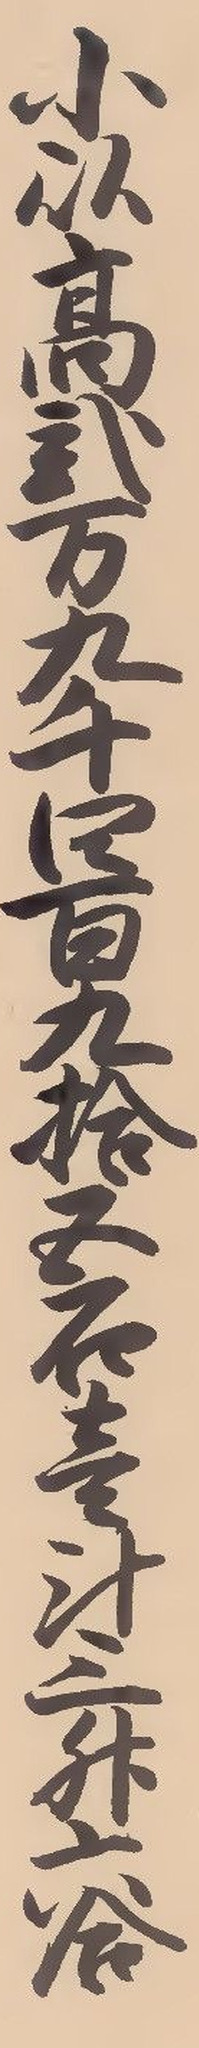小以高弐万九千四百九拾五石壱斗三升六合
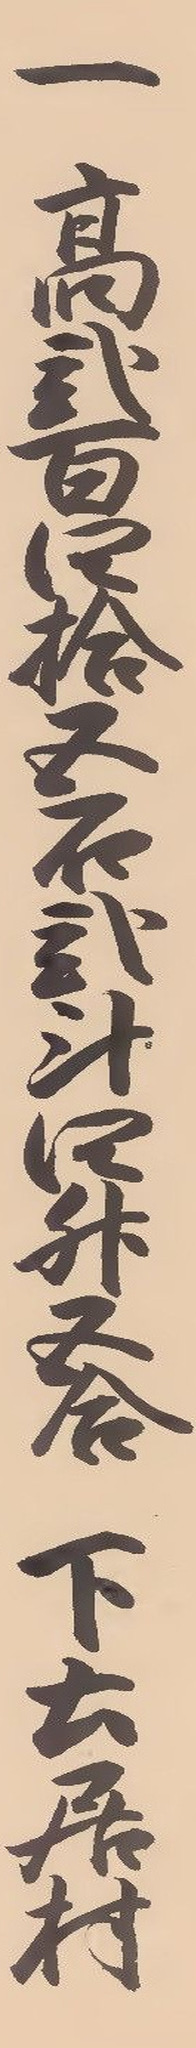一高弐百四拾五石弐斗四升五合下土居村
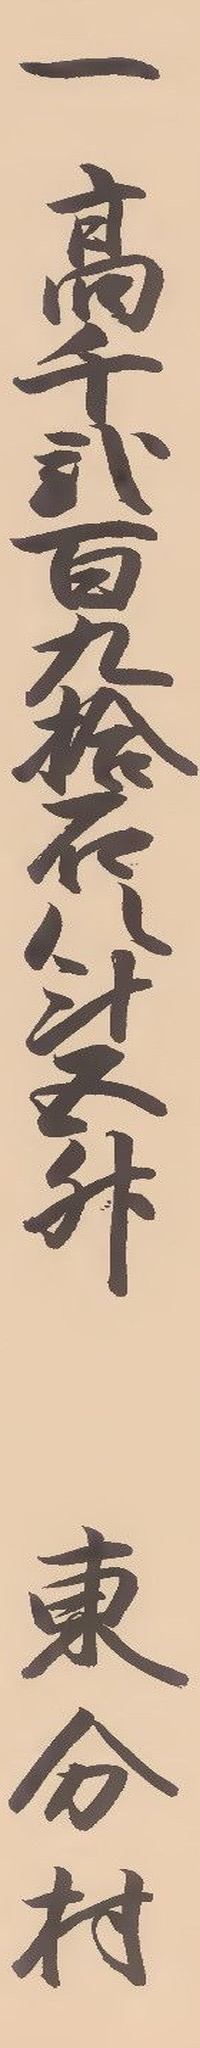一高千弐百九拾石八斗五升東分村
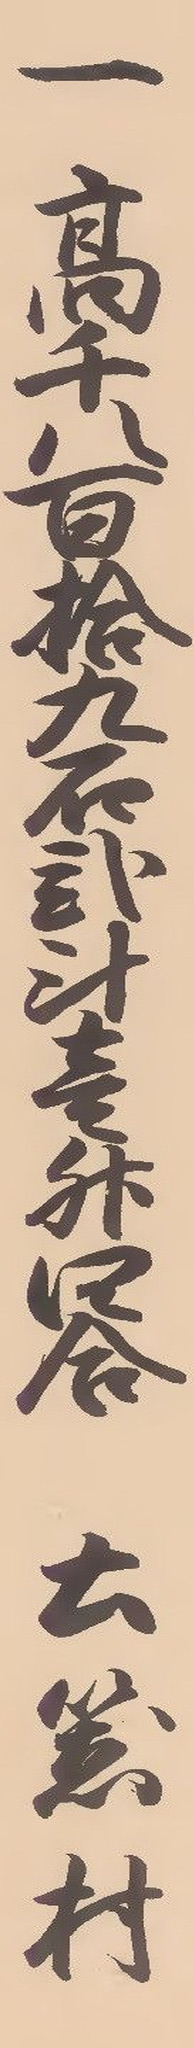一高千八百拾九石弐斗壱升四合土器村

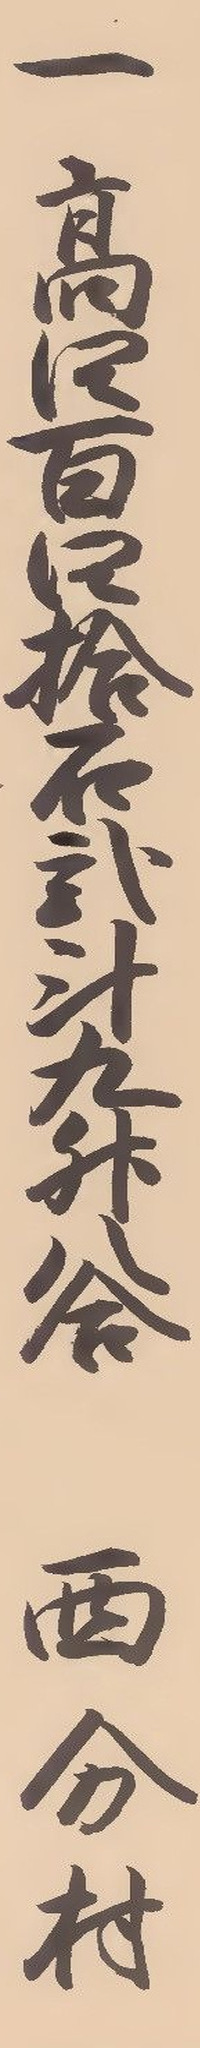一高四百四拾石弐斗九升八合西分村
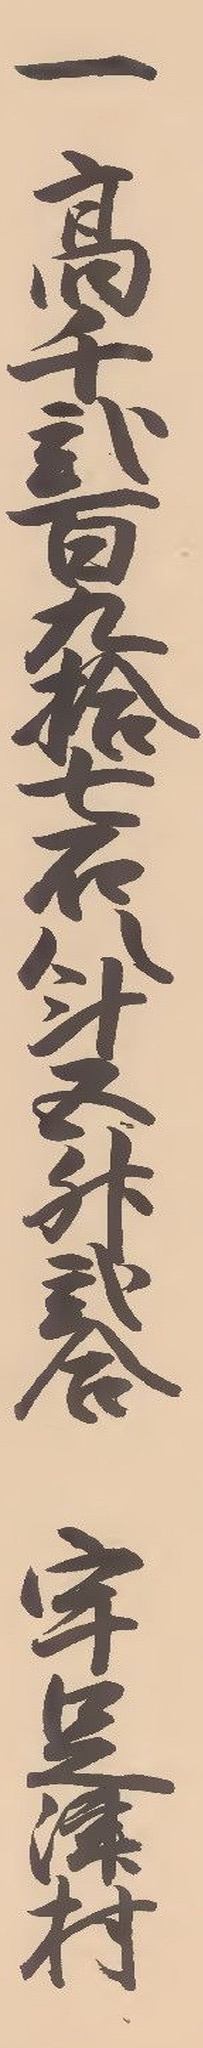一高千弐百九拾七石八斗五升弐合宇足津村
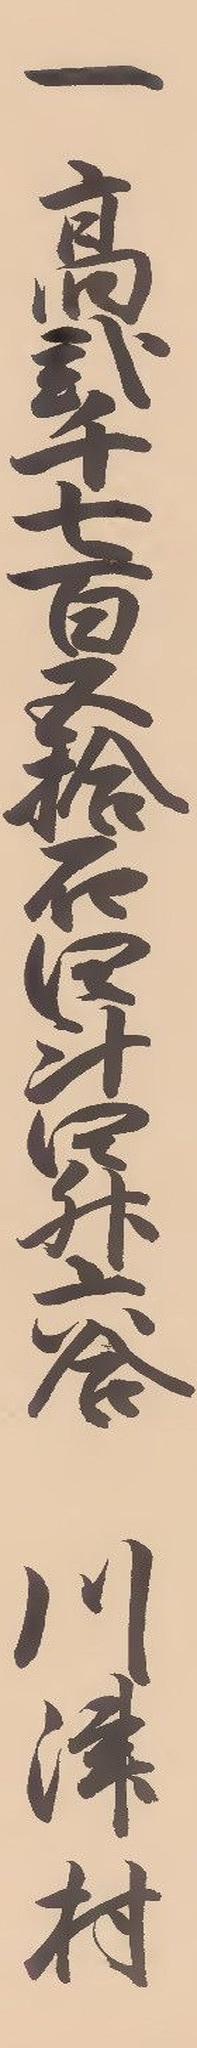一高弐千七百五拾石四斗四升六合川津村
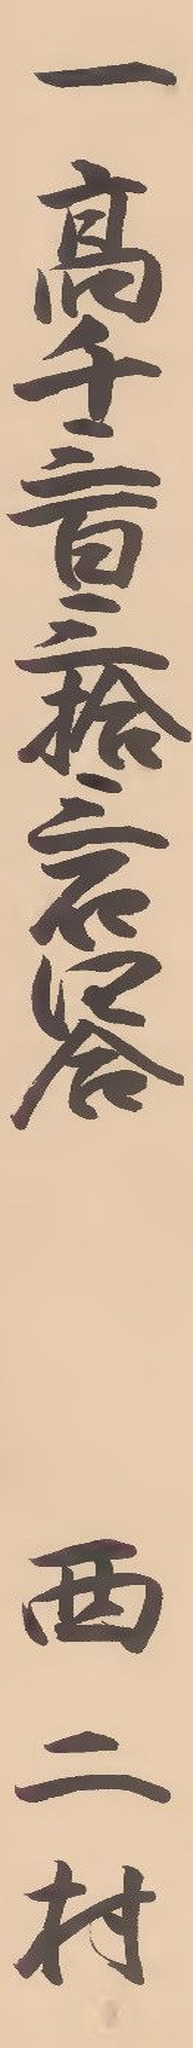一高千三百三拾三石四合西二村
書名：讃岐国郷帳
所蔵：国立公文書館 National Archives of Japan
